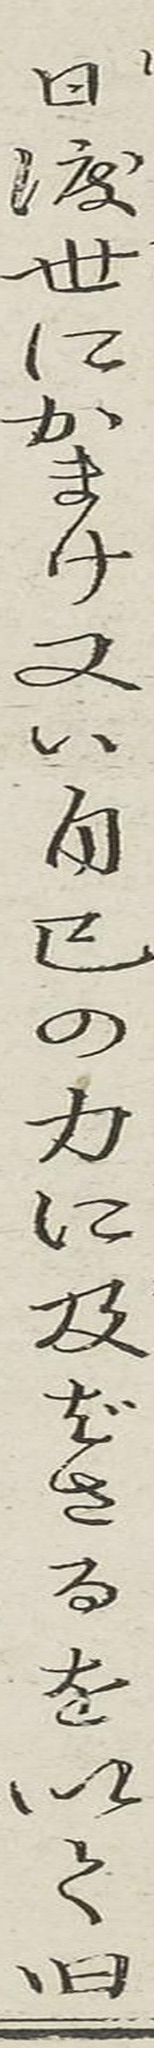日渡世にかまけ又は自己の力に及ばさるを以て旧
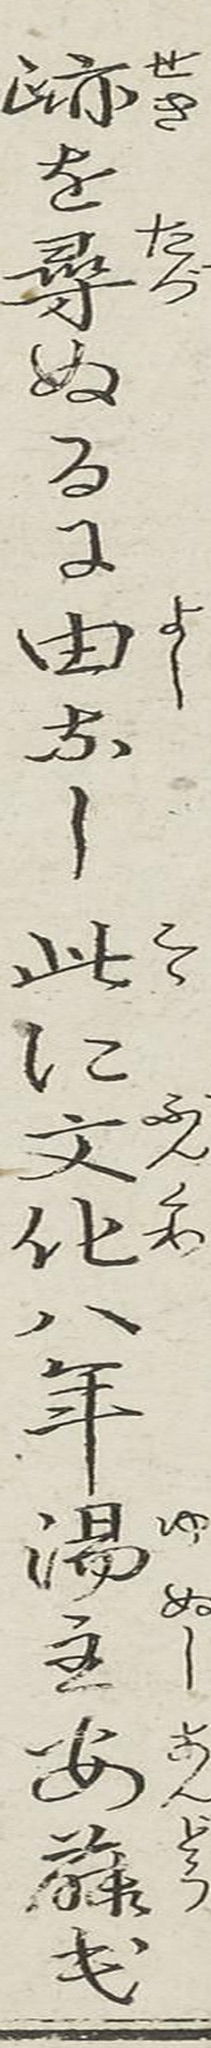跡を尋ぬるに由なし此に文化八年湯主安藤氏
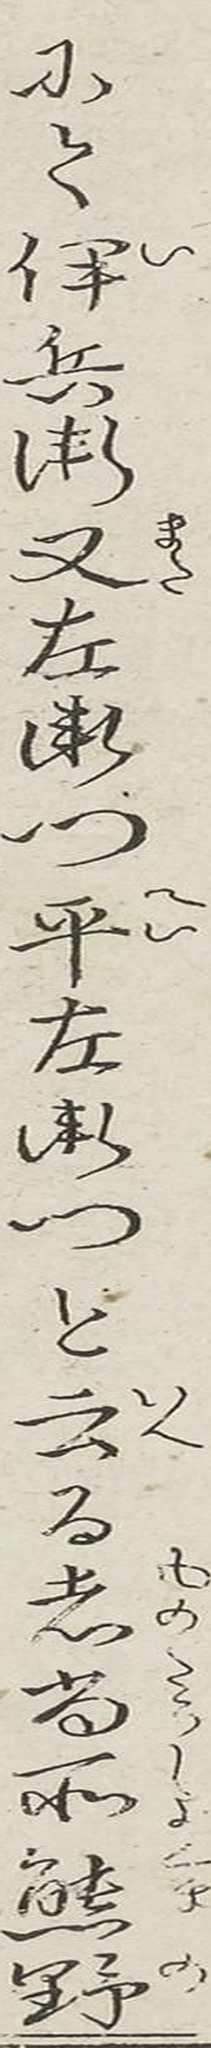にて伊兵衛又左衛門平左衛門と云る者当所熊野
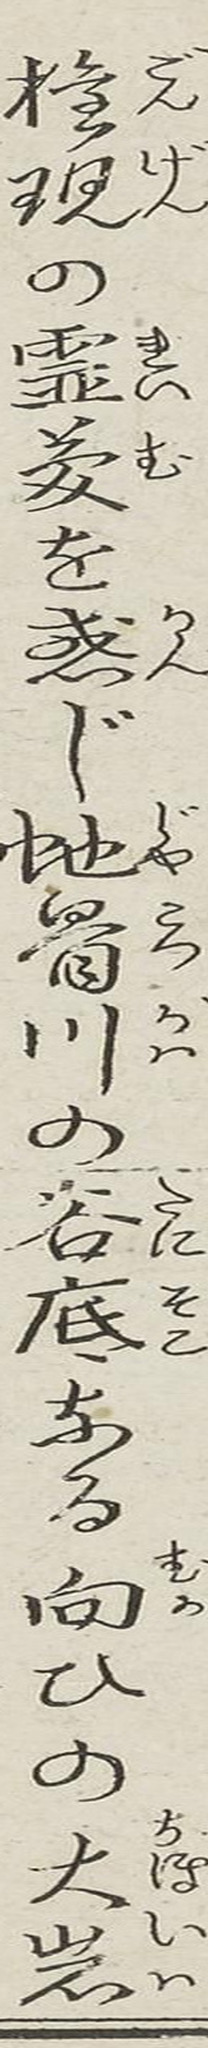権現の霊夢を感じ蛇骨川の谷底なる向ひの大岩
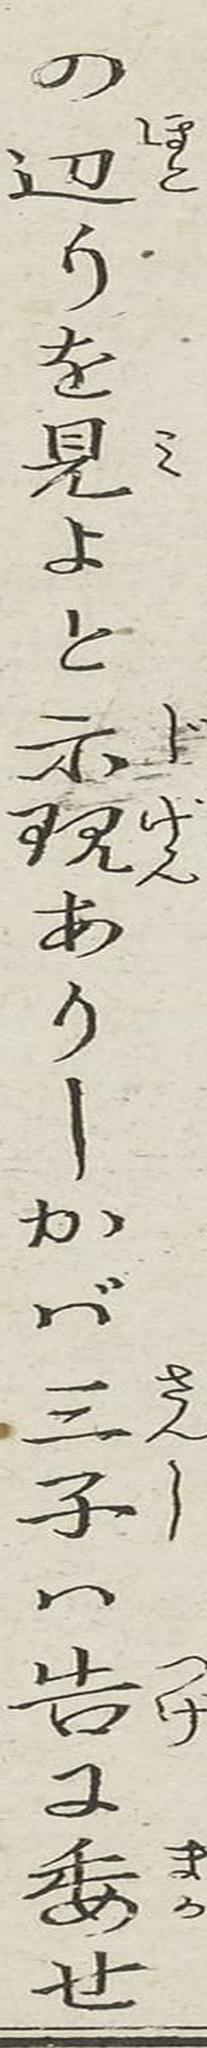の辺りを見よと示現ありしかば三子は告に委せ
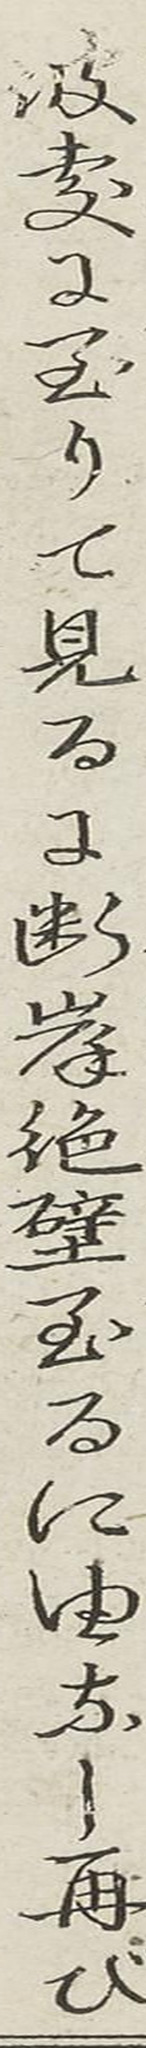彼処に至りて見るに断岸絶壁至るに由なし再び
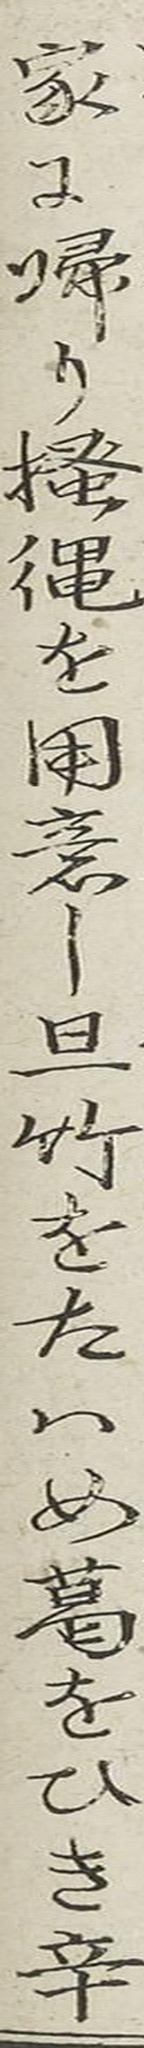家に帰り搔縄を用意し且竹をたはめ葛をひき辛
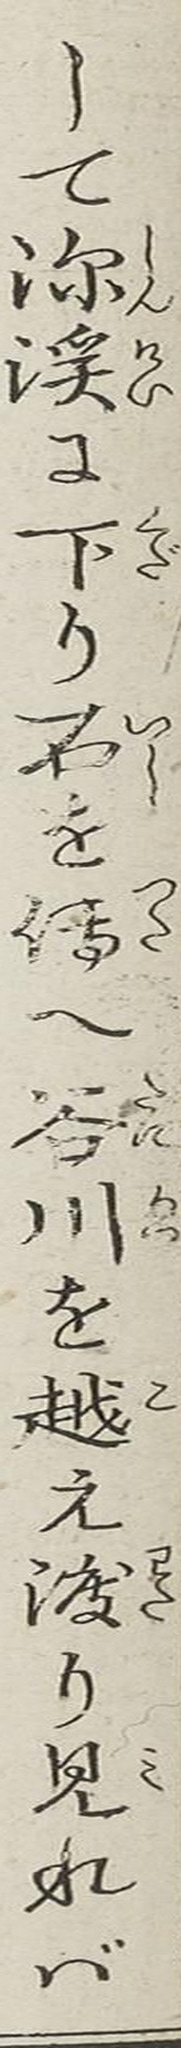して深溪に下り石を伝へ谷川を越え渡り見れば
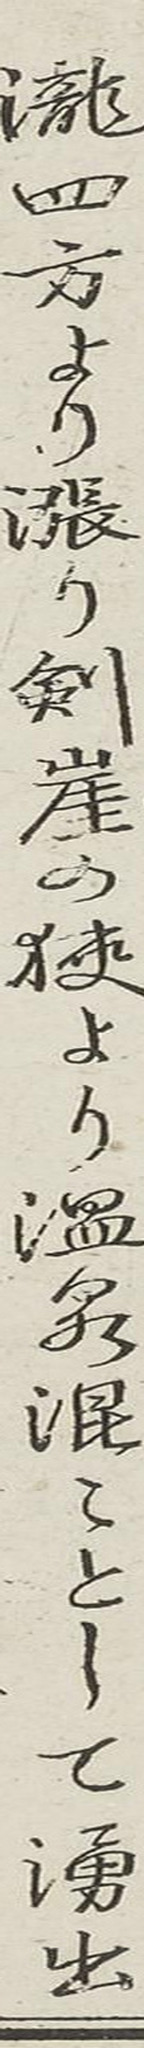瀧四方より漲り剣崖の狭より温泉混々として湧出
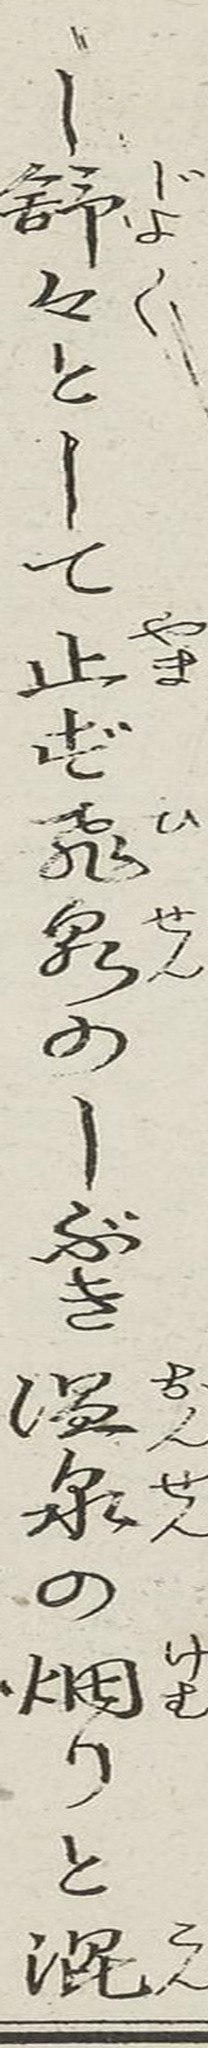し舒々として止ず飛泉のしぶき温泉の烟りと混
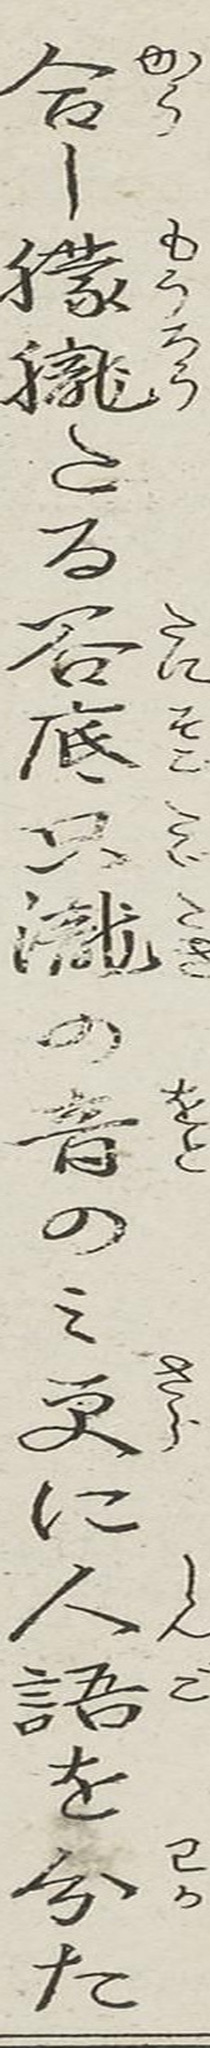合し朦朧たる谷底只瀧の音のみ更に人語を分た
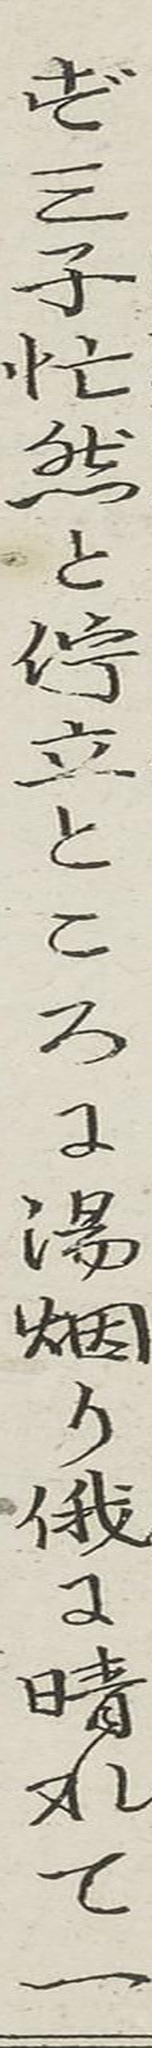ず三子忙然と佇立ところに湯烟り俄に晴れて一
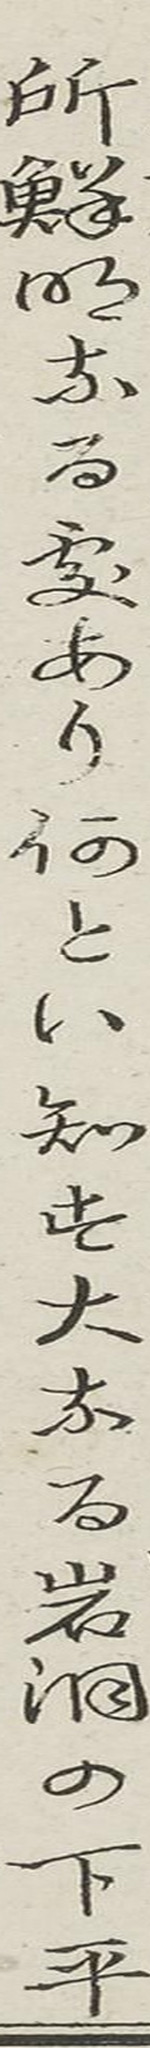所鮮明なる処あり何とは知す大なる岩洞の下平
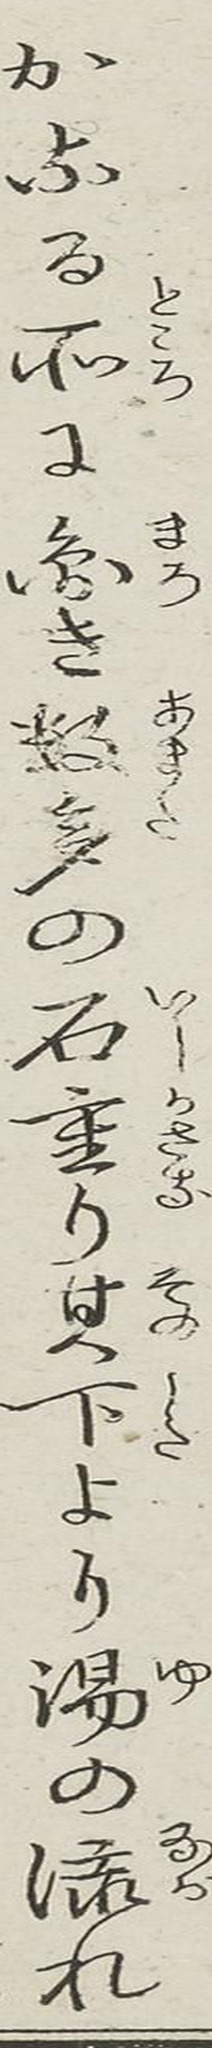かなる所に円き数多の石重り其下より湯の流れ
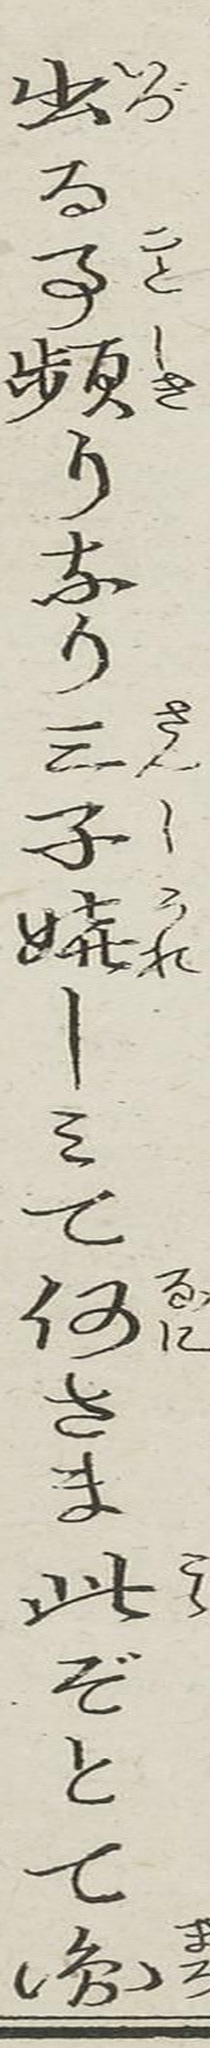出る事頻りなり三子嬉しみて何さま此ぞとて円
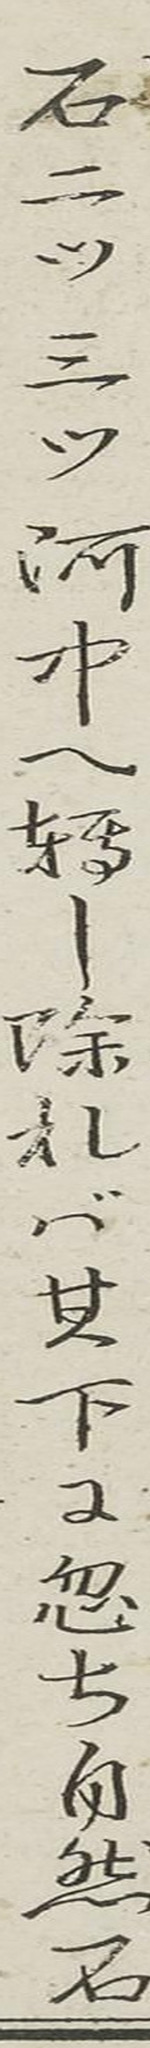石二ッ三ッ河中へ転し除れば其下に忽ち自然石
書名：箱根温泉誌　全
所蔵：東京大学地震研究所図書室 Earthquake Research Institute Library, The University of Tokyo, JAPAN
